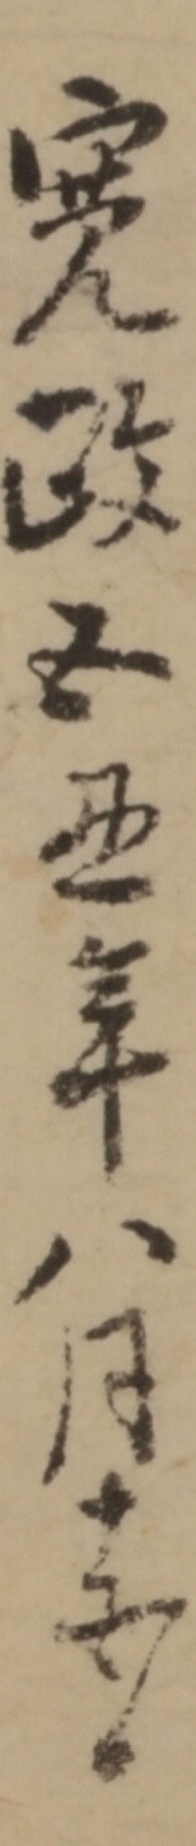寛政五丑年八月十五日
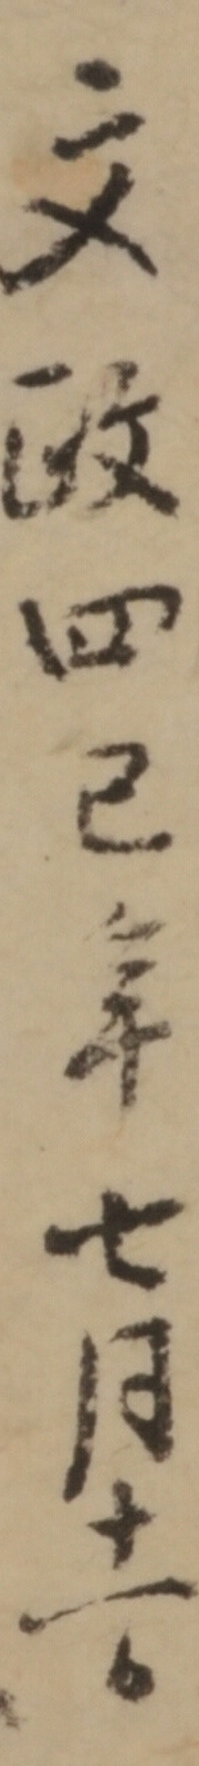文政四巳年七月十一日
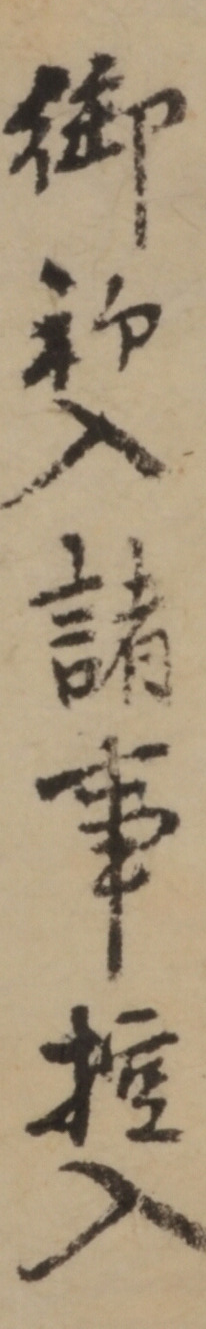御初入諸事控入
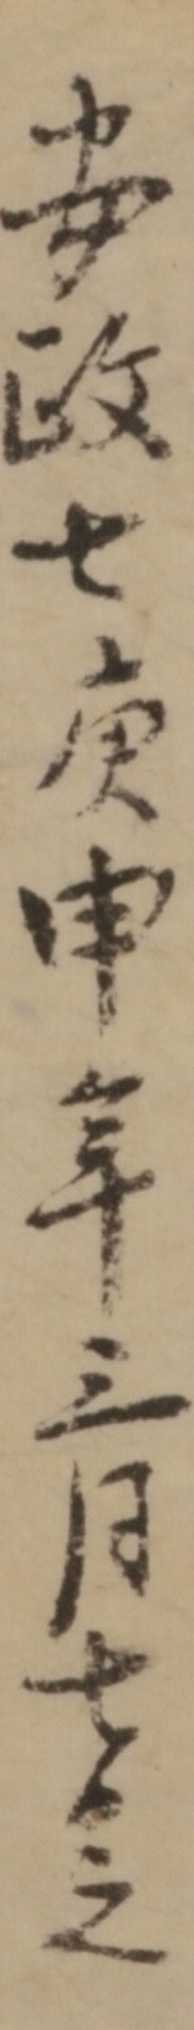安政七庚申年三月七日之
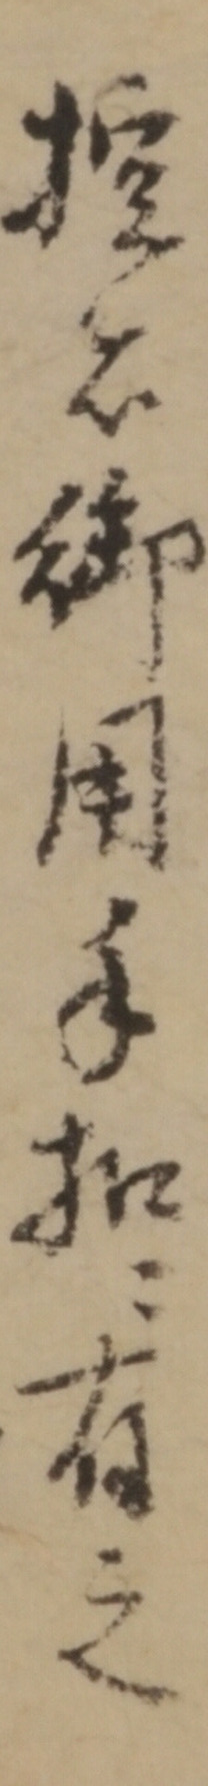控は御用手扣に有之
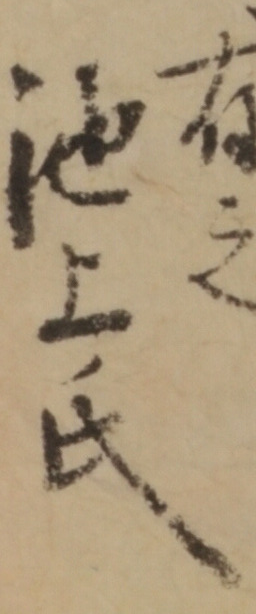池上氏

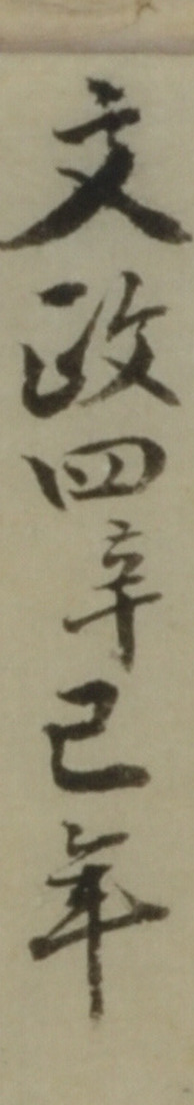文政四辛巳年
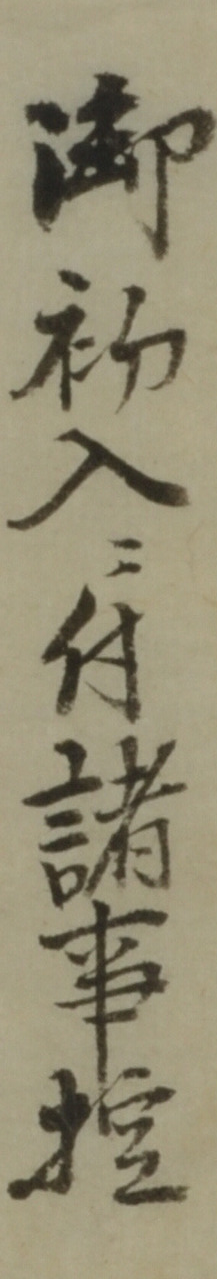御初入ニ付諸事控

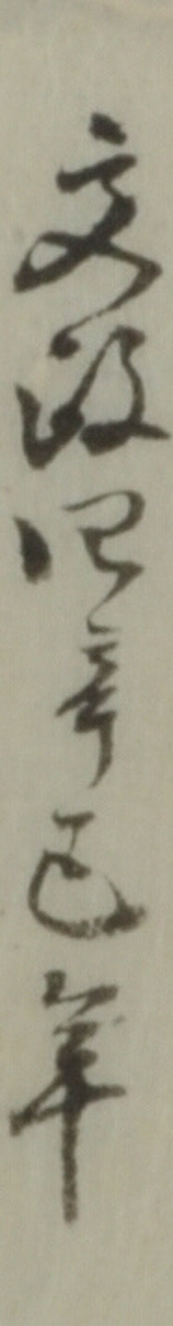文政四辛巳年
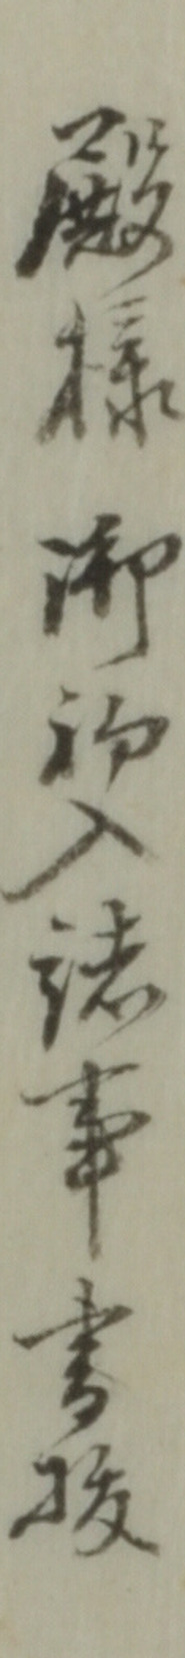殿様御初入諸事書抜
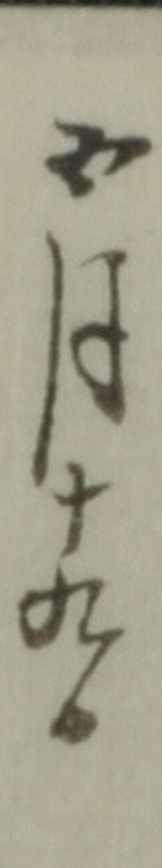五月十九日
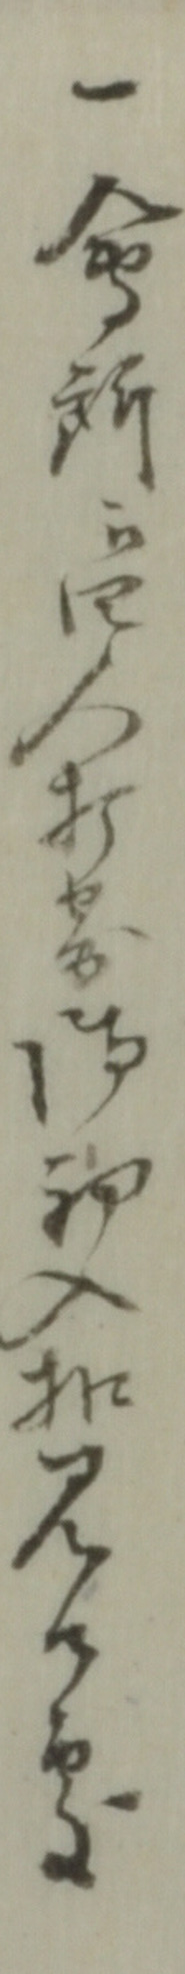一会所え四人打寄御初入扣見候処
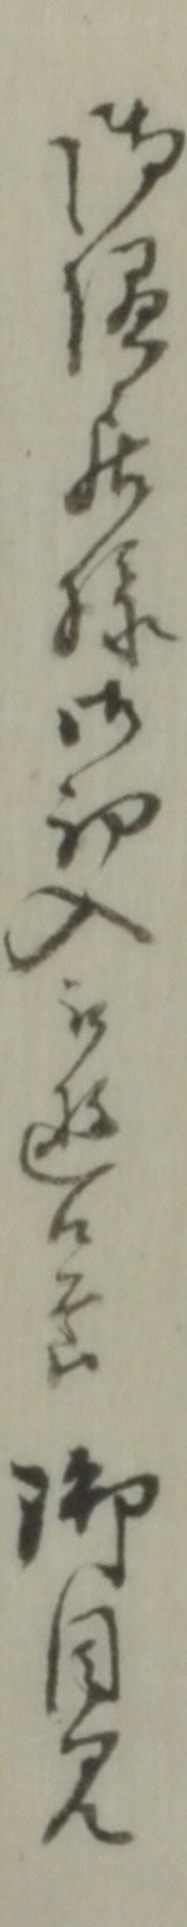御隠居様御初入被遊候節御目見
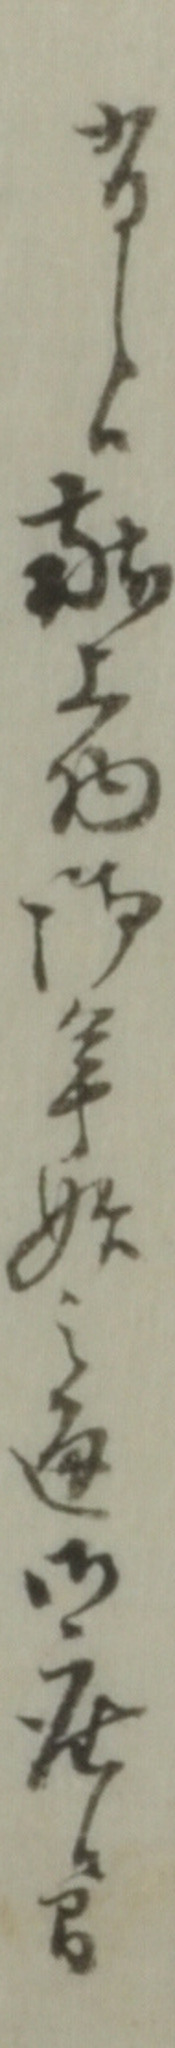有之候献上物御年始之通御座候間
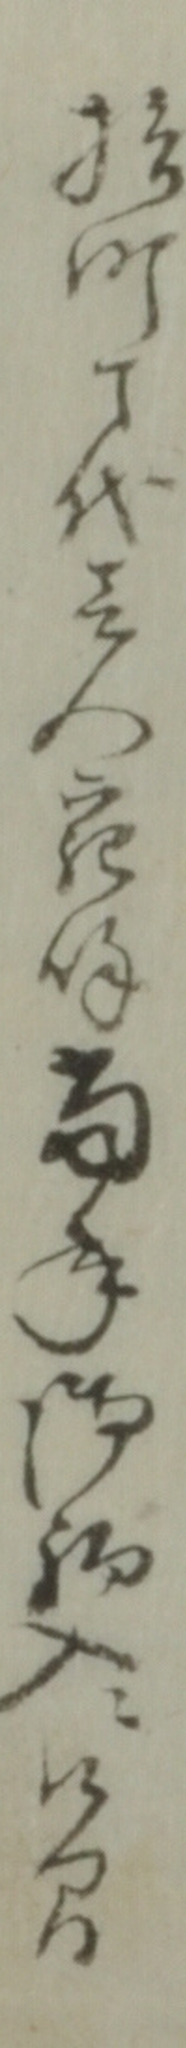拾町丁代壱人宛呼両手御初物入に候間
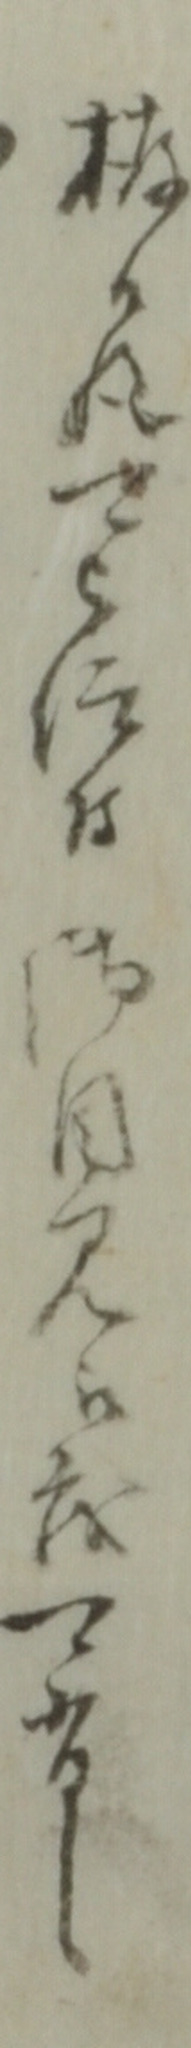拵候様可被仰付御目見えも可有之
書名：御初入諸事控
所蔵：伊那市立高遠町図書館・合同会社AMANE
